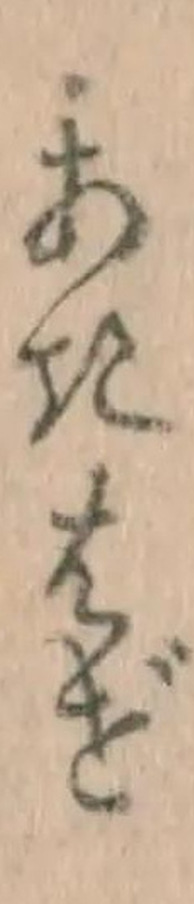あきはぜ
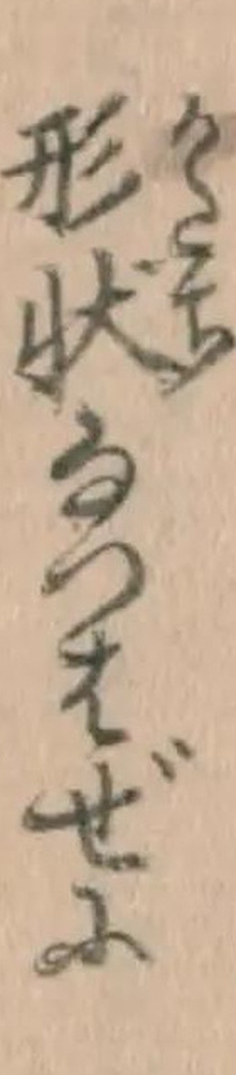形状なつはぜに
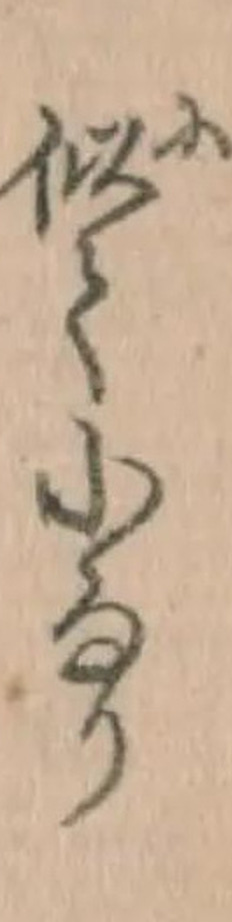似て小なり
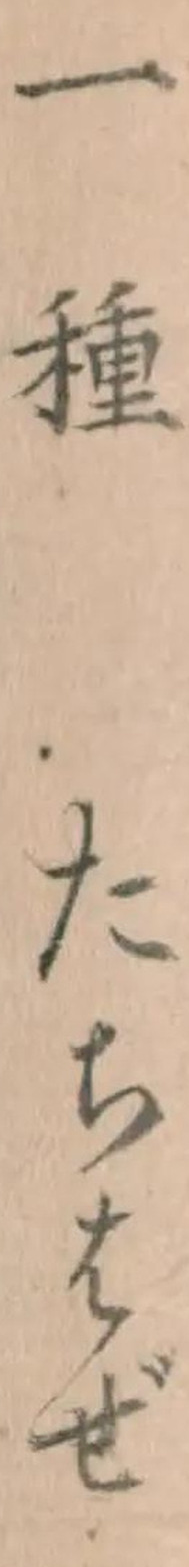一種たちはぜ
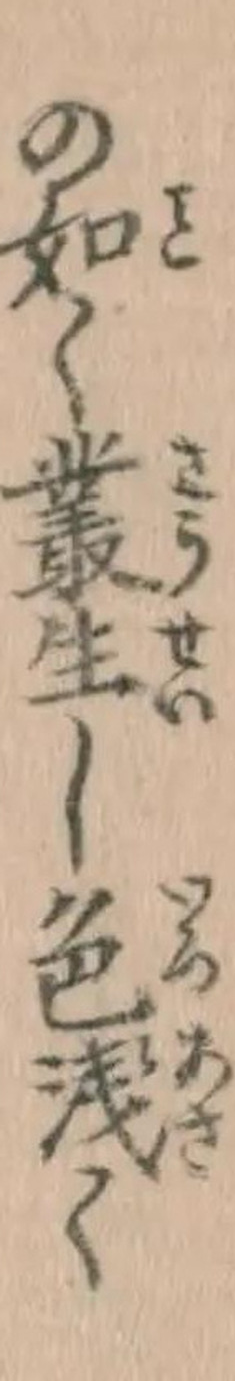の如く叢生し色浅く
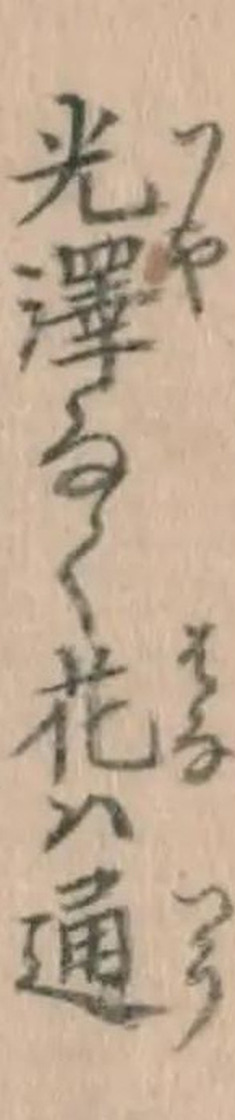光沢なく花は通
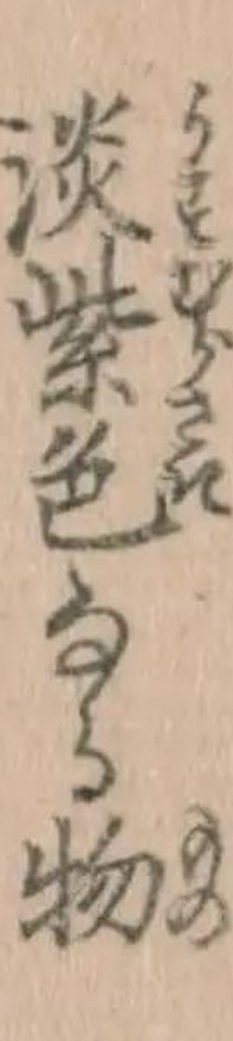淡紫色なる物
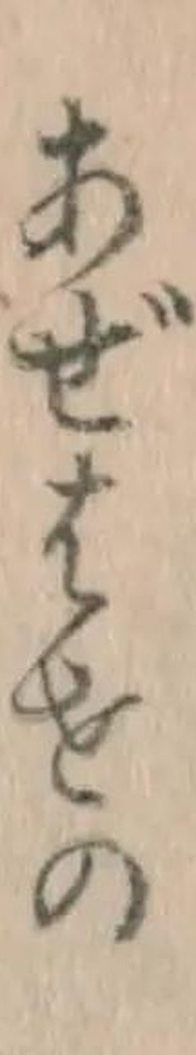あぜはせの
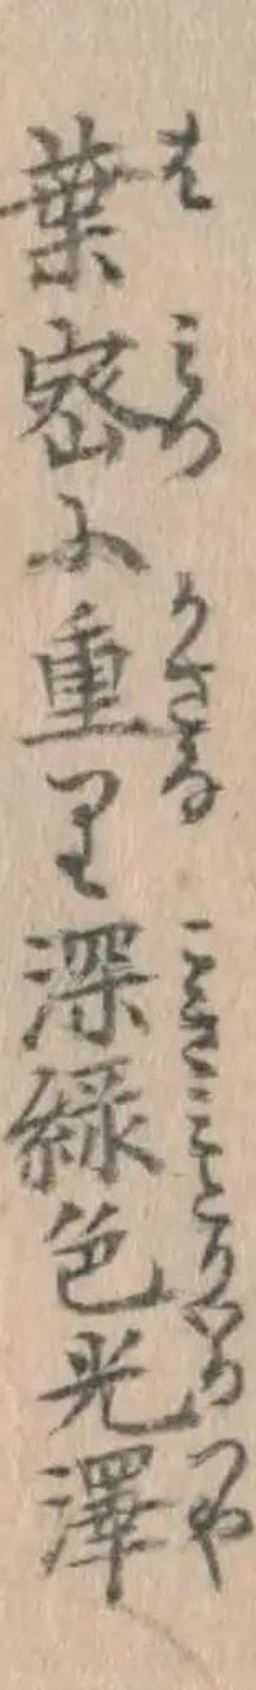葉密に重り深緑色光沢
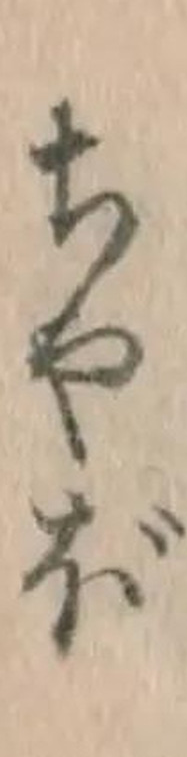ちやぼ
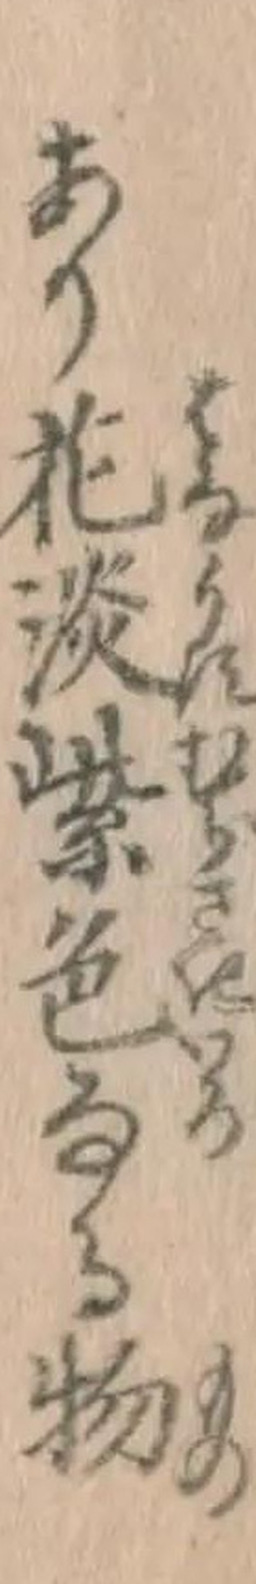あり花淡紫色なる物

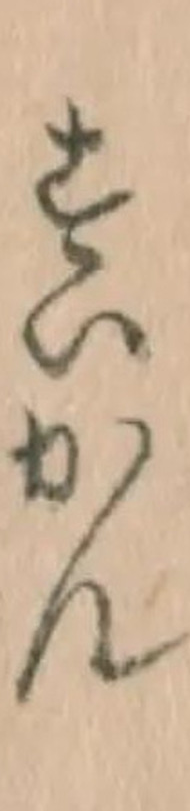すいかん
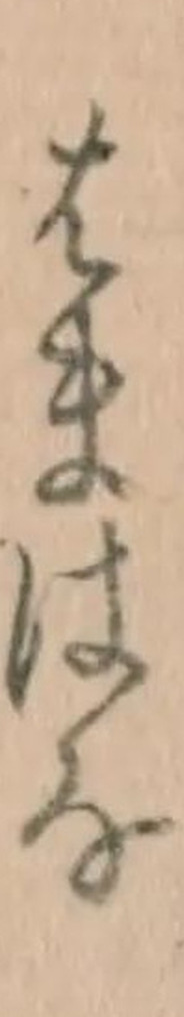はまはな
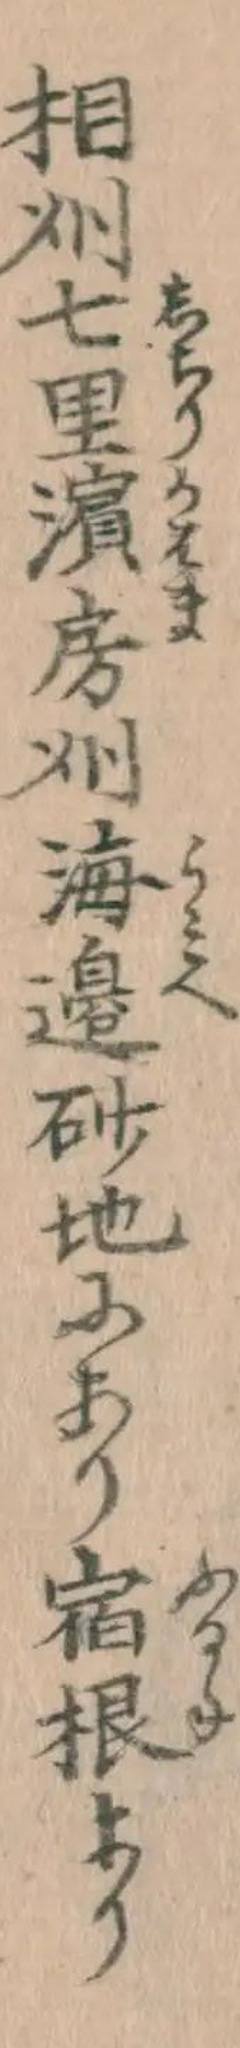相州七里浜房州海辺砂地にあり宿根より
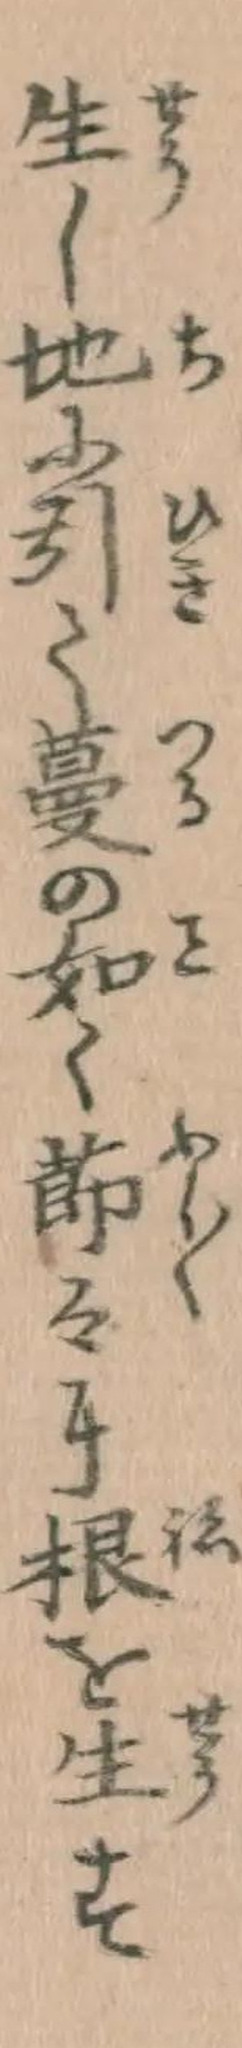生し地に引て蔓の如く節々に根を生す
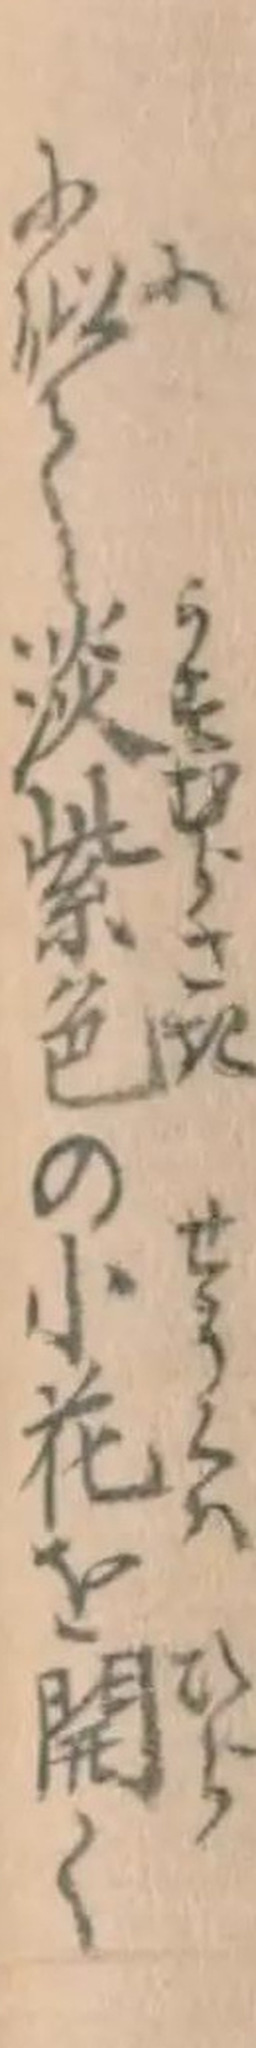に似て淡紫色の小花を開く
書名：本草図譜. 巻34-36
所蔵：国立国会図書館 National Diet Library, JAPAN
